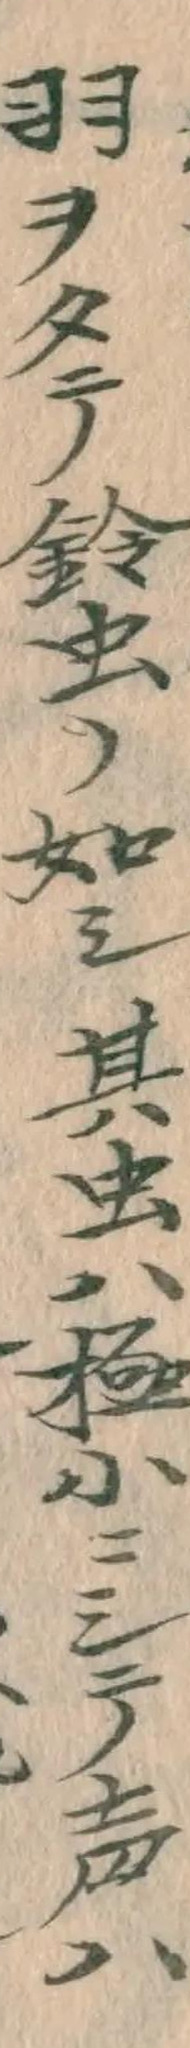羽ヲタテ鈴虫ノ如シ其虫ハ極小ニシテ声ハ
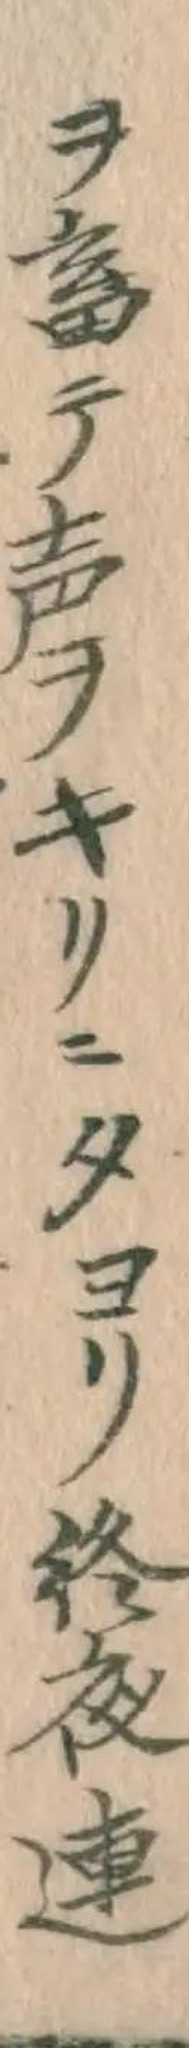ヲ畜テ声ヲキクニタヨリ終夜連
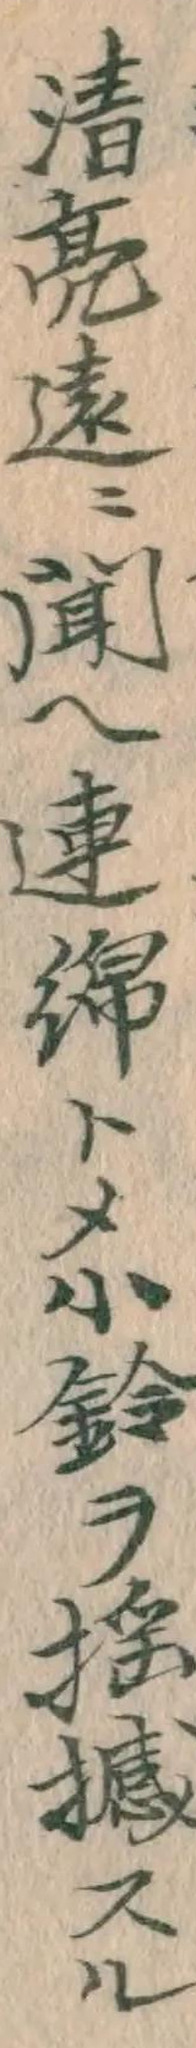清亮遠ニ聞ヘ連綿トシテ小鈴ヲ揺撼スル
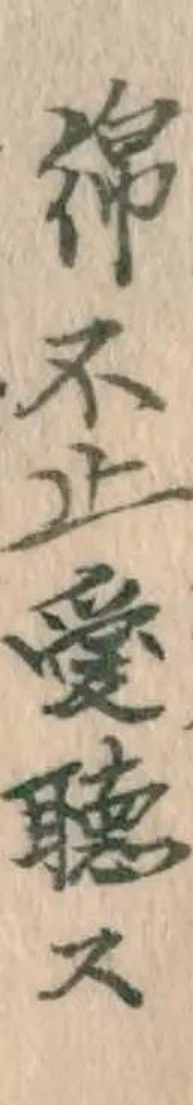綿不止愛聴ス
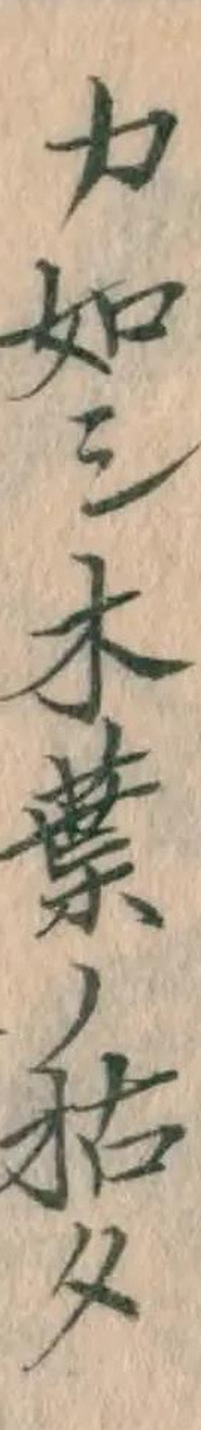カ如シ木葉ノ枯タ
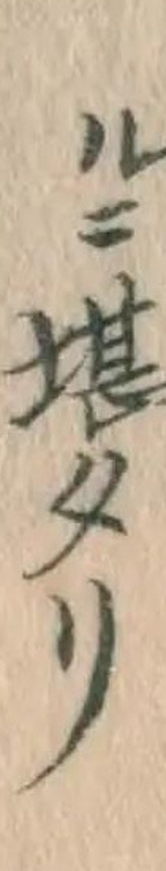ルニ堪タリ
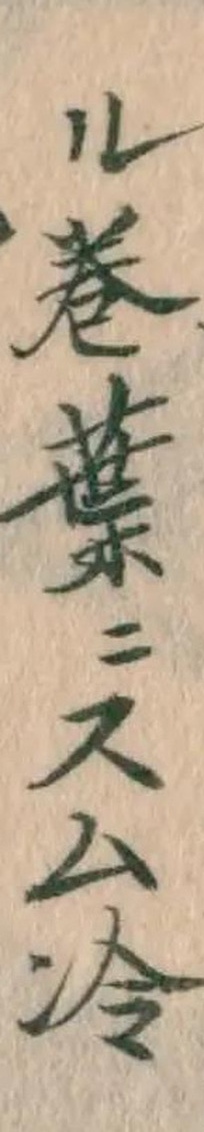ル巻葉ニスム冷
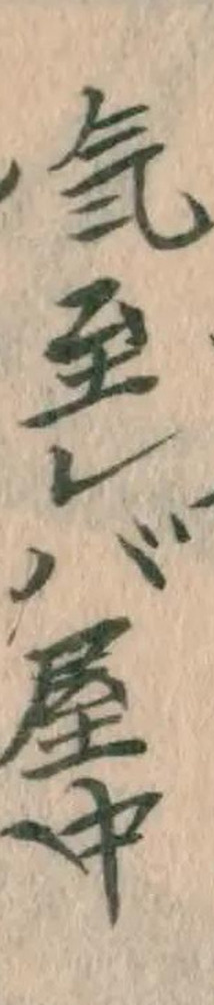気至レバ屋中
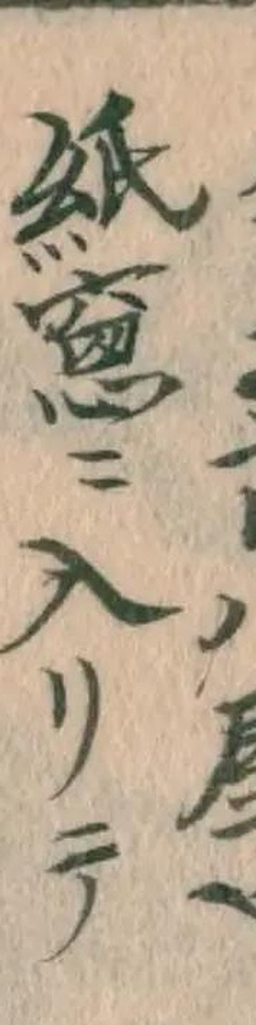紙窓ニ入リテ
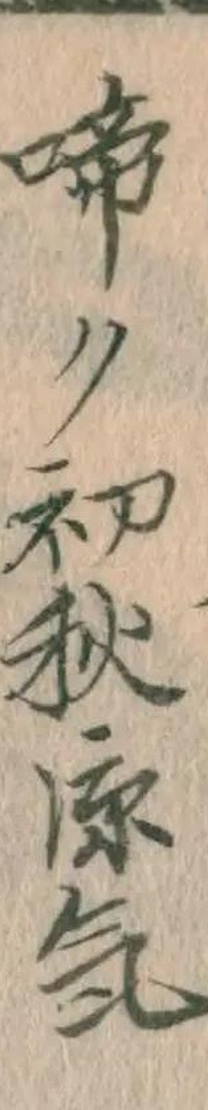啼ク初秋涼気
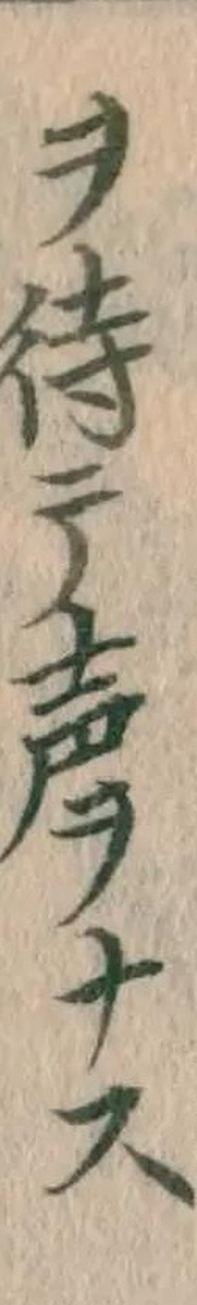ヲ待テ声ヲナス
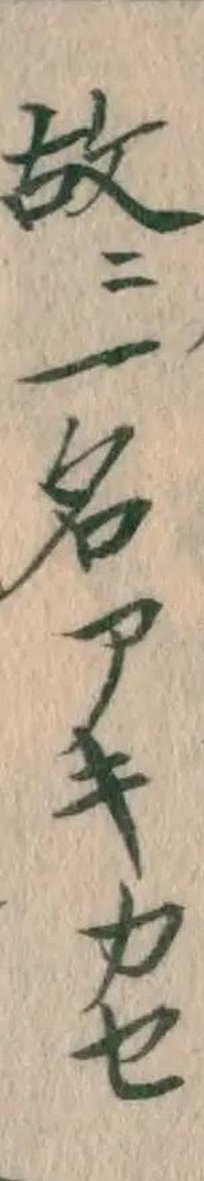故ニ一名アキカセ
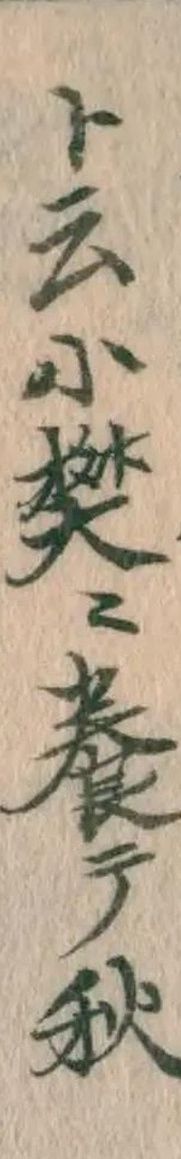ト云小焚ニ養テ秋
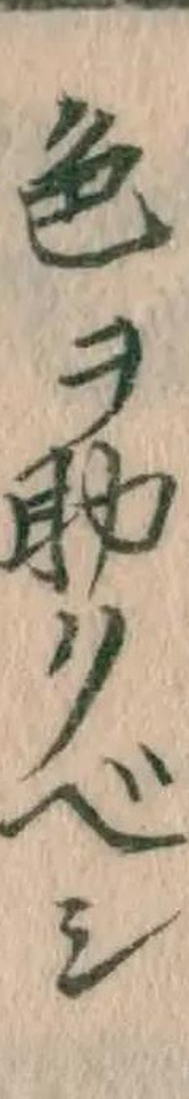色ヲ助クベシ
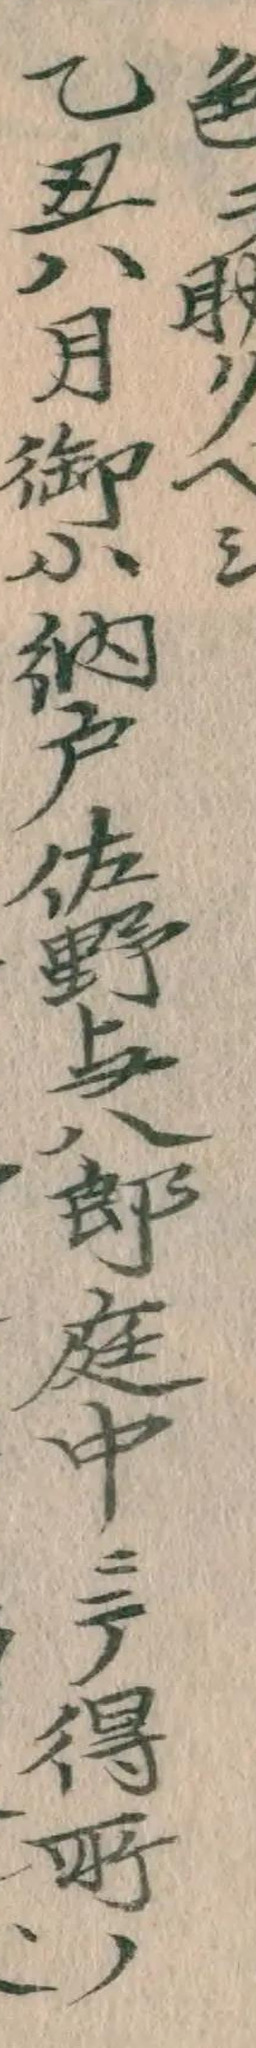乙丑八月御小納戸佐野与八郎庭中ニテ得所ノ
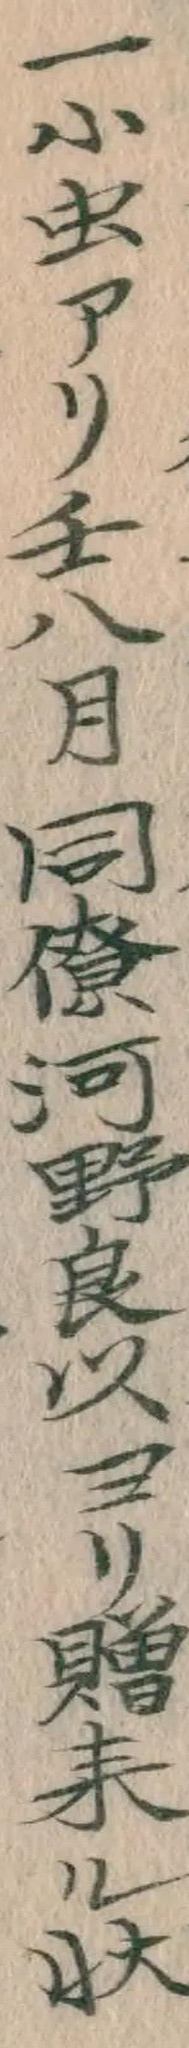一小虫アリ壬八月同僚河野良以ヨリ贈来ル状
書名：千蟲譜 3巻. [3]
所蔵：国立国会図書館 National Diet Library, JAPAN
